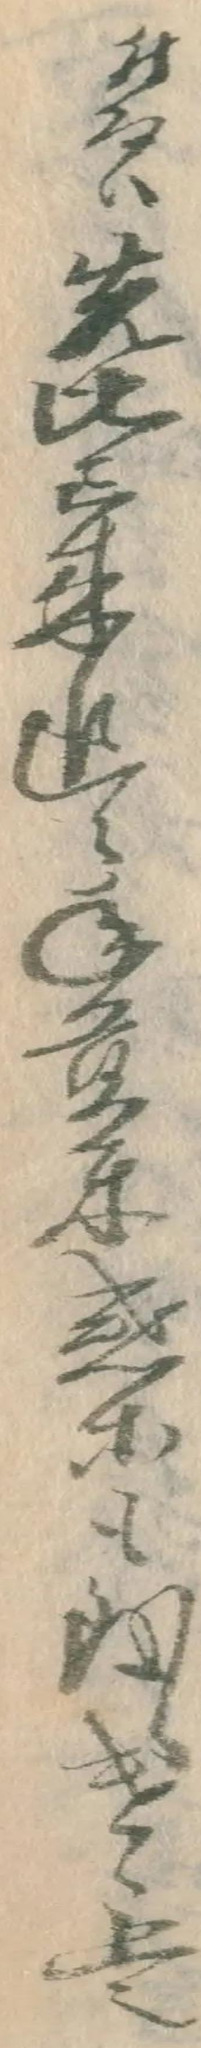付而ハ先比已来追々年貢米惑等も致し遣候上也

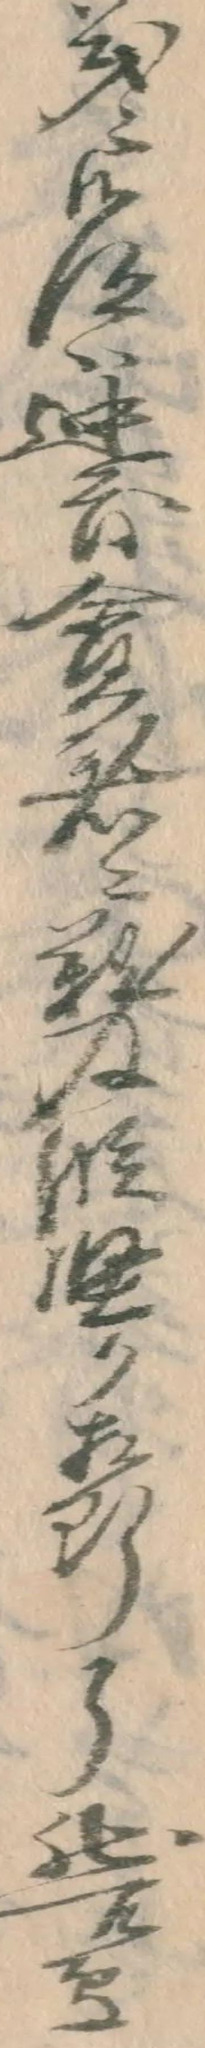義ニ候得ハ迚も貧者ニ難及段堅ク相断了然ル處
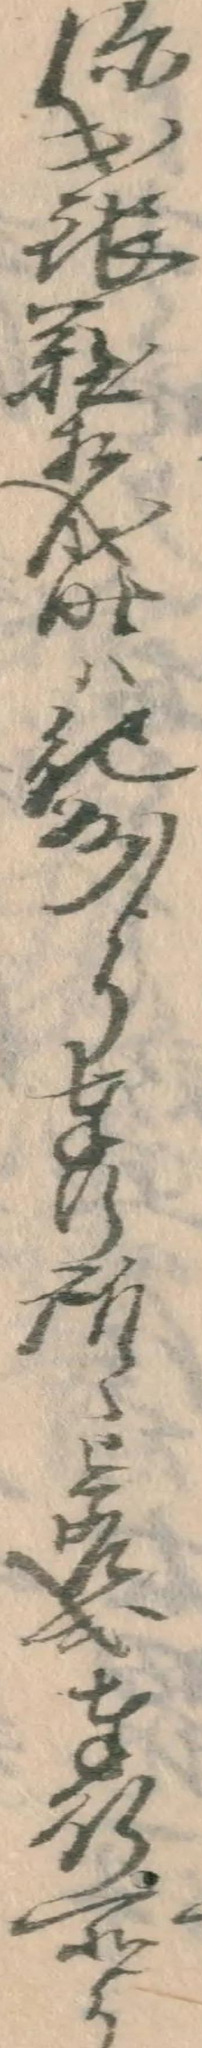弥出銀難相成時ハ紀州より奉行所へ被差出奉行候所より
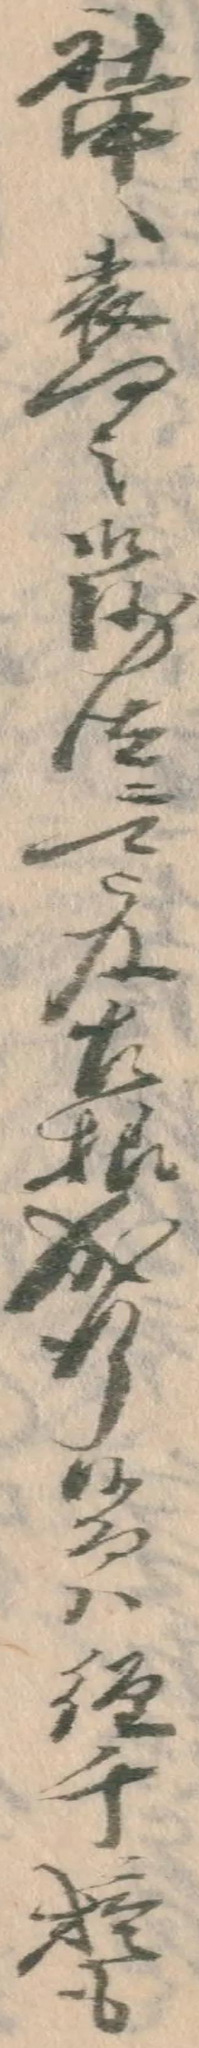社中へ表向之御沙汰に可被及左様成行候而ハ経千ニ於も
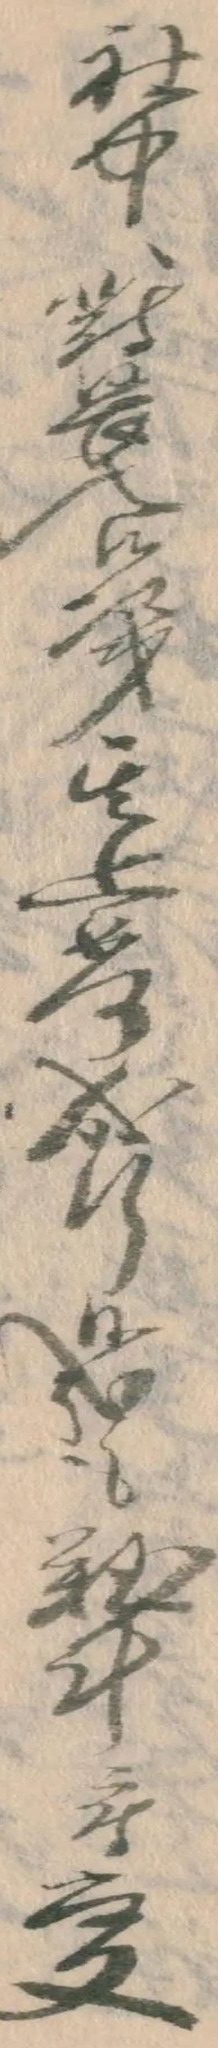社中へ對畏入候義其上如何成行候哉も難計ニ付尚又
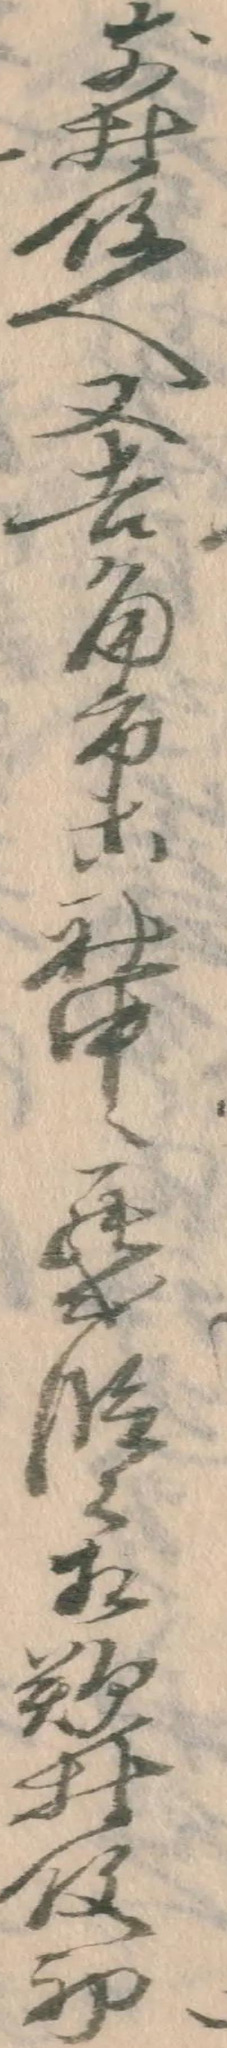両村役人又吉角未社中へ罷出段々相歎村役勤
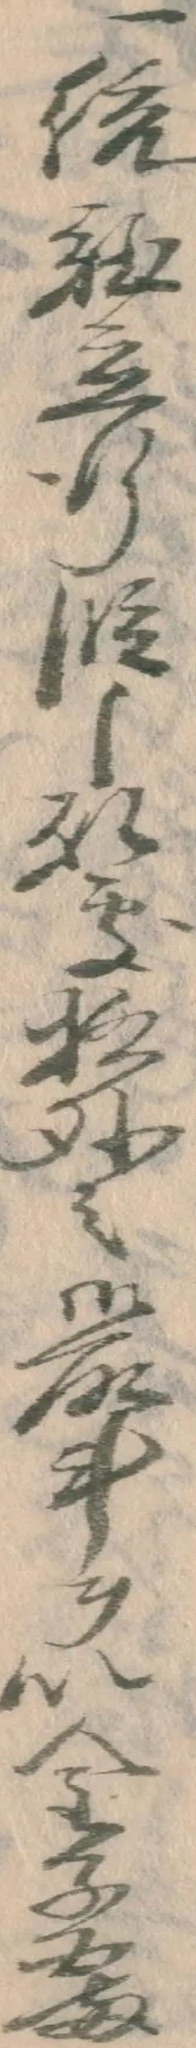一統難立行段申願處松外之御取計ヲ以金子五両
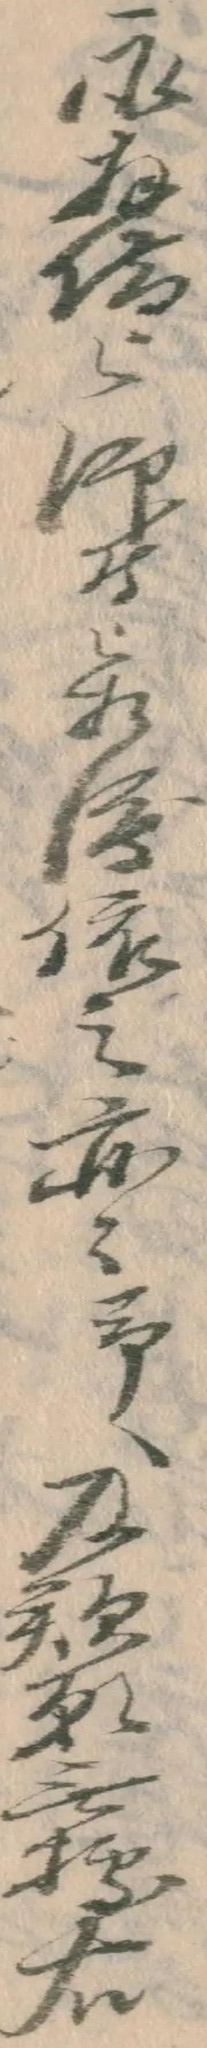永拝借被仰付被相渡依之亦々予へ及歎願無拠右
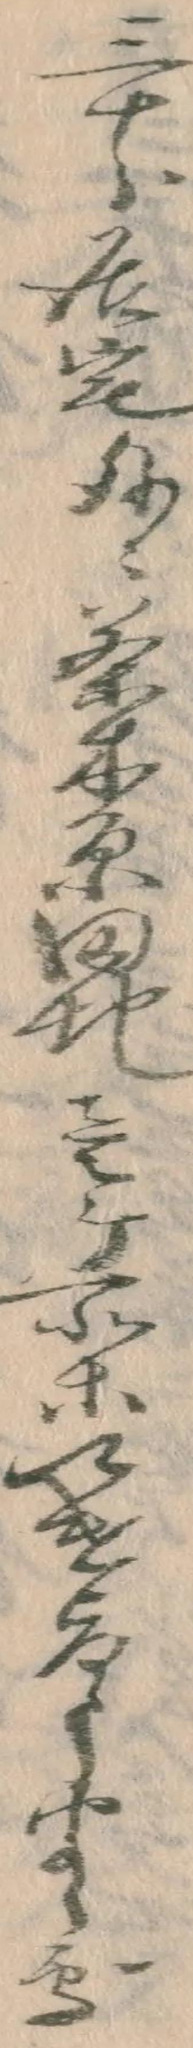三十郎居宅外二茶木原田地壱ヶ所等可遣旨申聞候處
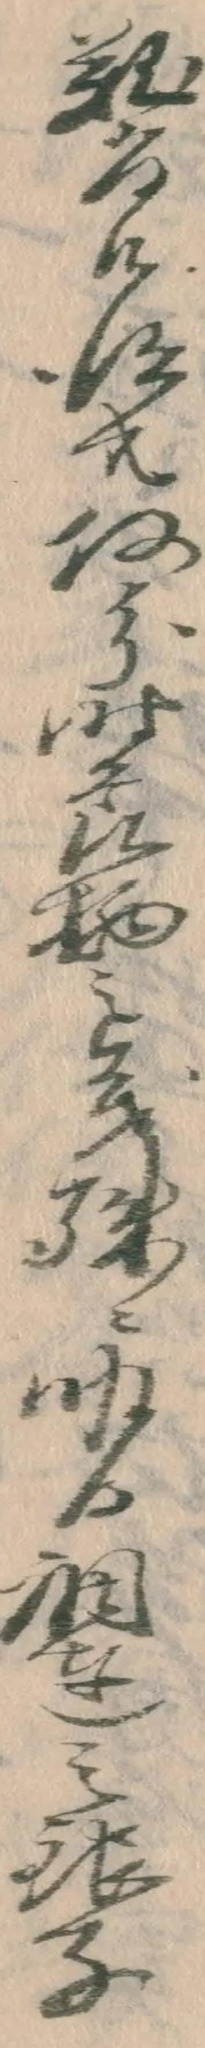難有候得共何分時節柄之義殊ニ明日調達之銀子
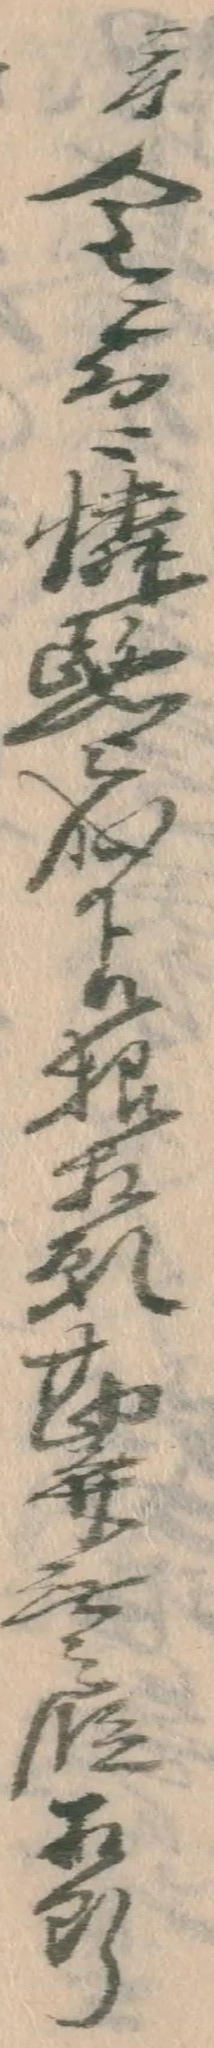ニ付金ニ而ハ憐愍被成下候様相願勘弁無之段相断
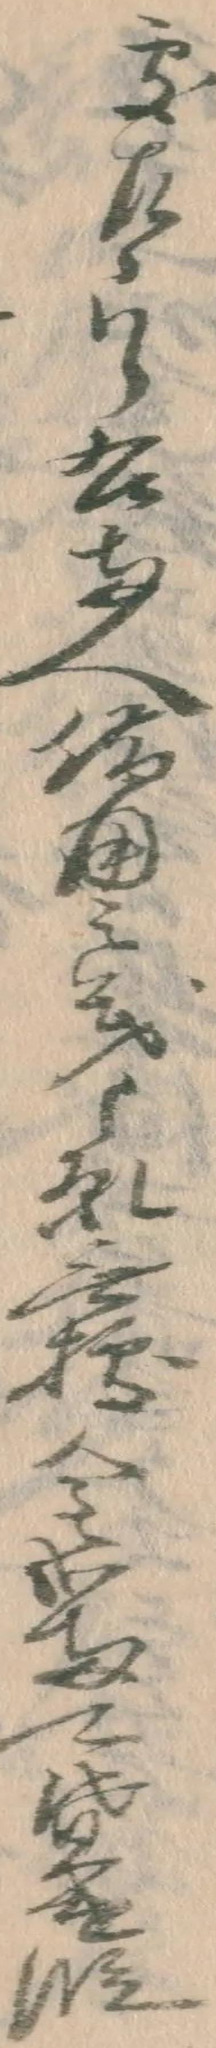處左候ハヽ右両人借用之義申配無拠金弐両可貸遣段
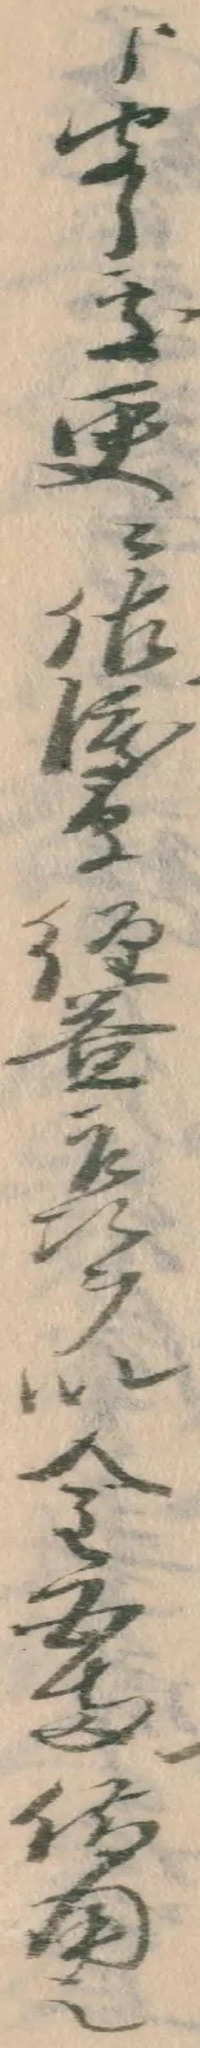ト聞候処更ニ佐渡守経益差次ヲ以金国両借用之
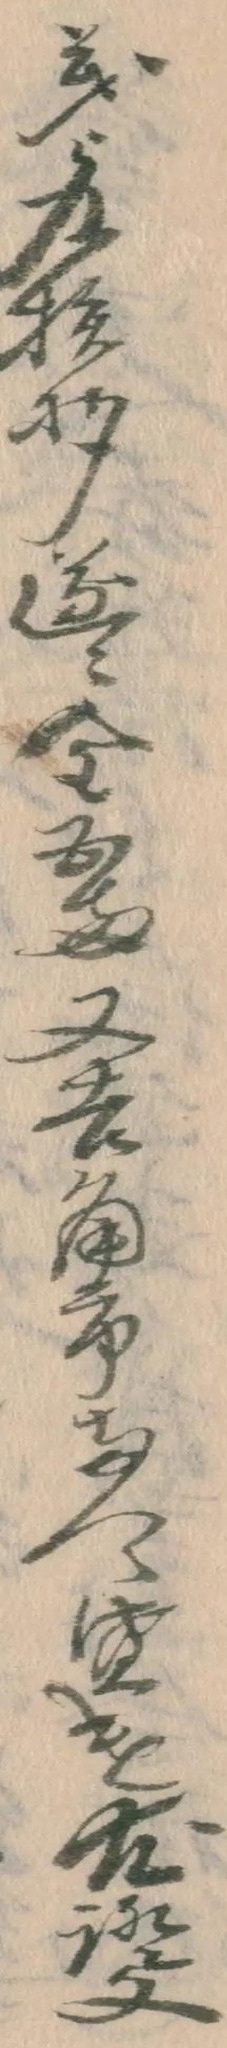義ハ及挨拶遂ニ金五両又吉角市両人へ宜遣尤證文
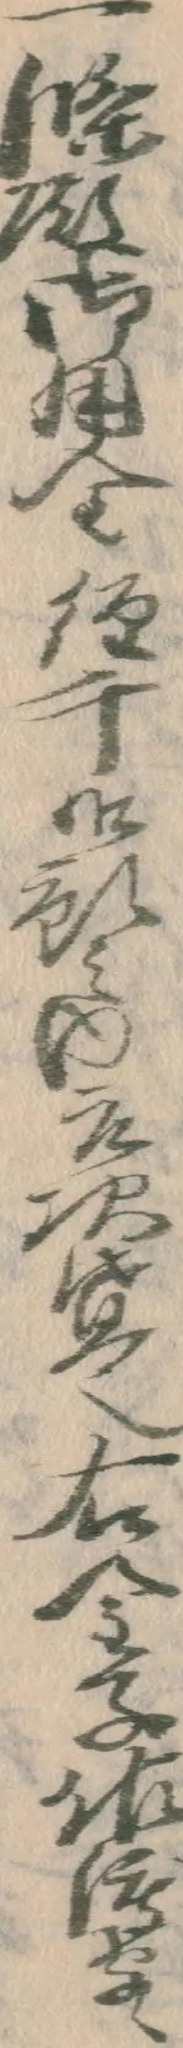一條殿御用金経干御預之内取次貸也右金子佐渡守へ
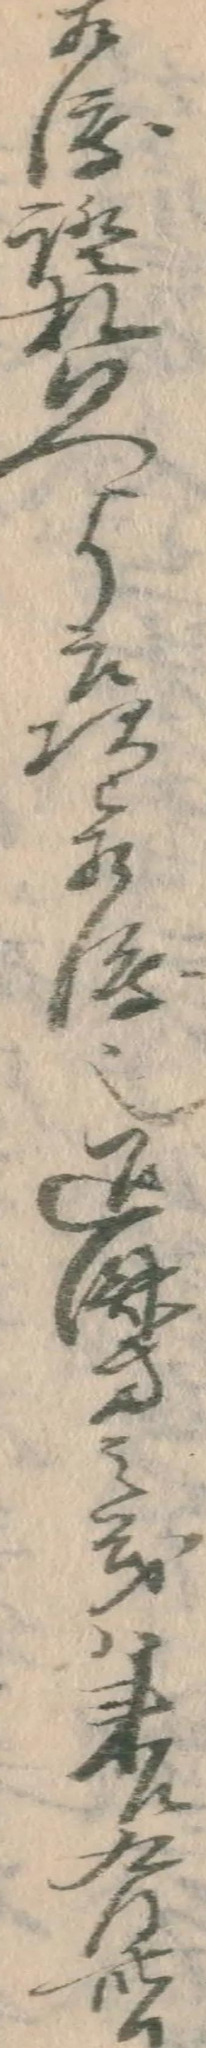相渡證札同人より取次被相渡也退済方之義ハ来ル九月丗日
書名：賀茂社記録. 第67冊
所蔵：国立国会図書館 National Diet Library, JAPAN
